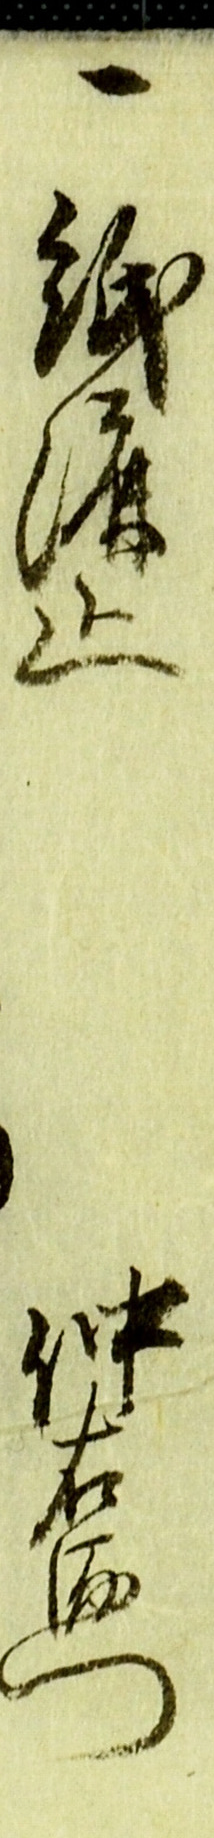一紙漉止仲右衛門
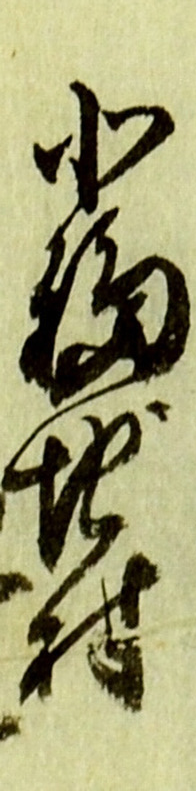北福地村
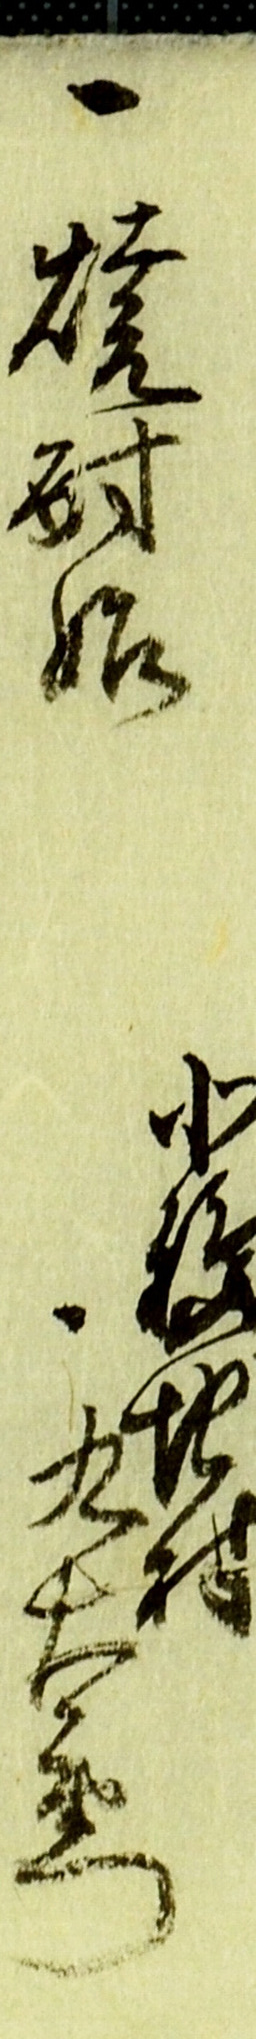一焼酎始九右衛門
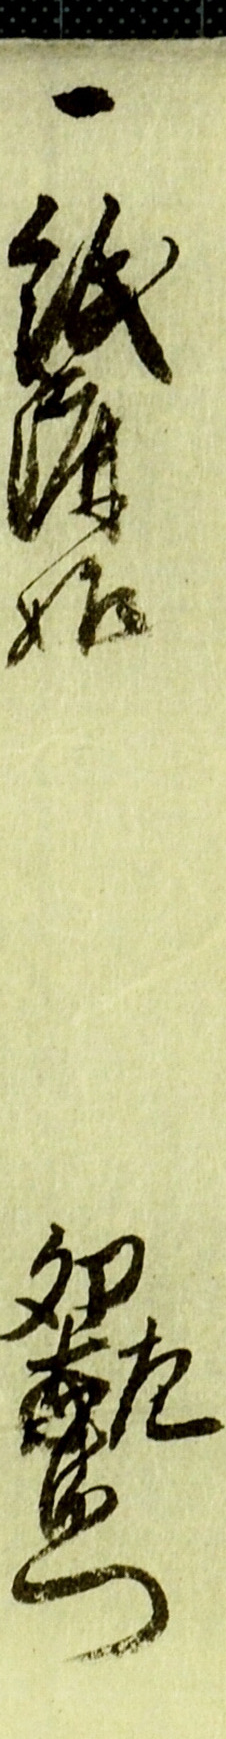一紙漉止仲右衛門
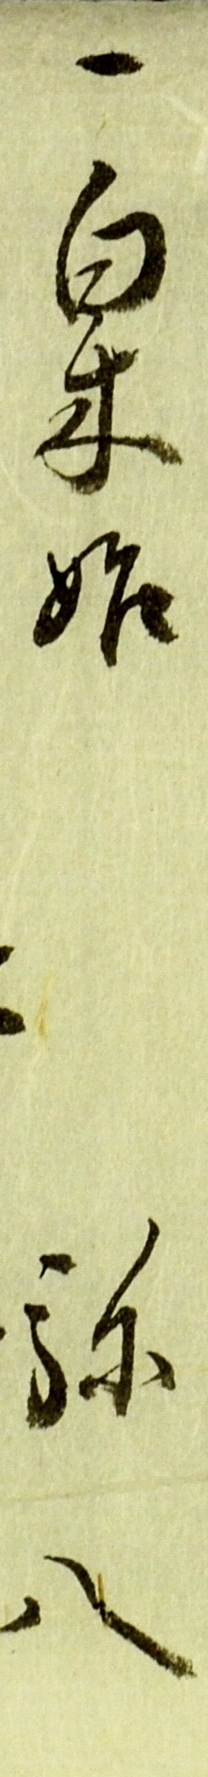一白木始弥八
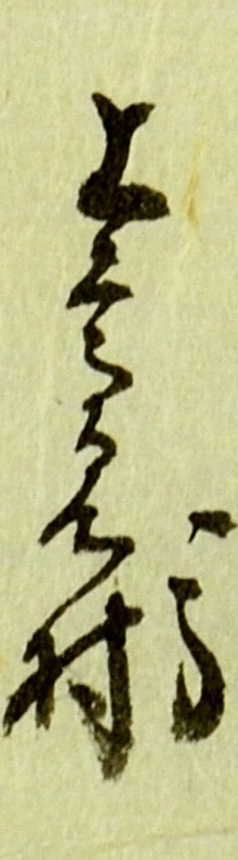上高見村
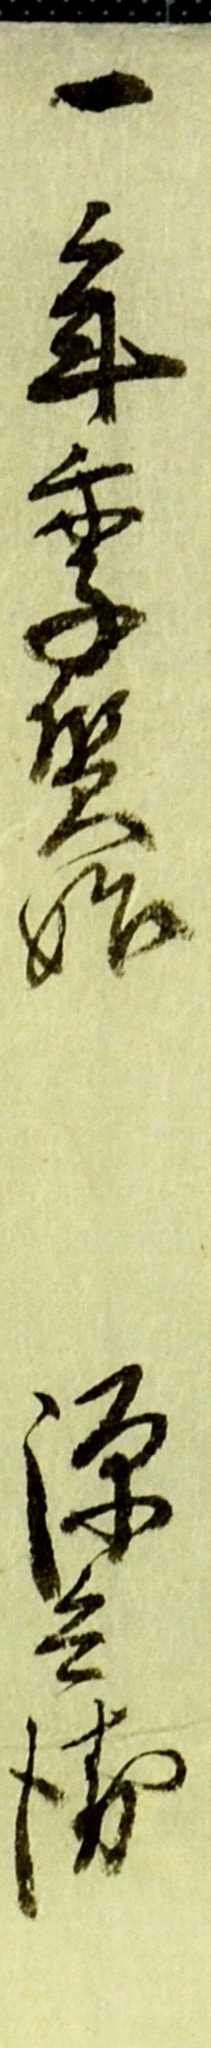一年季質始源兵衛
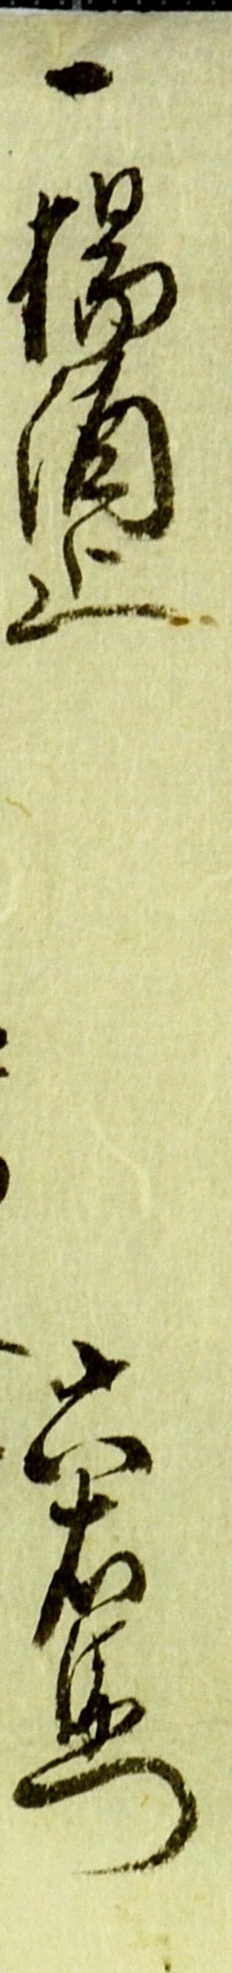一揚酒止六右衛門
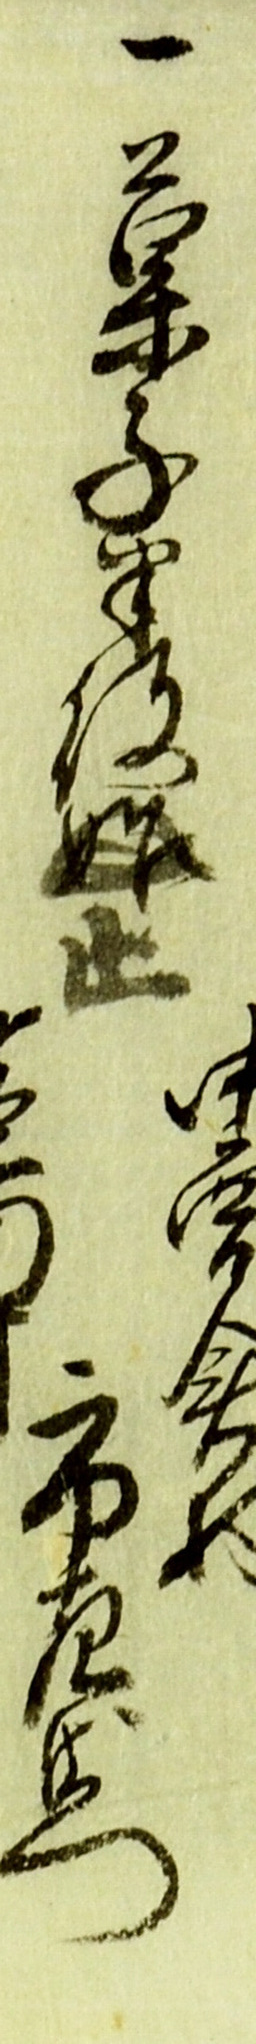一菓子半役止市左衛門
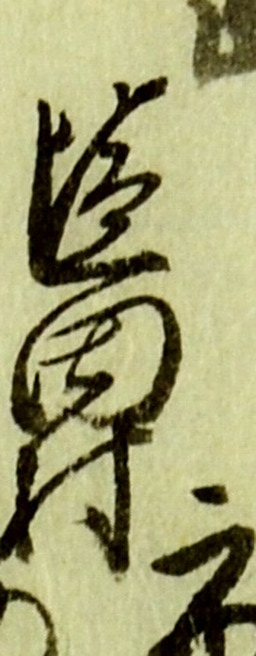塩田村

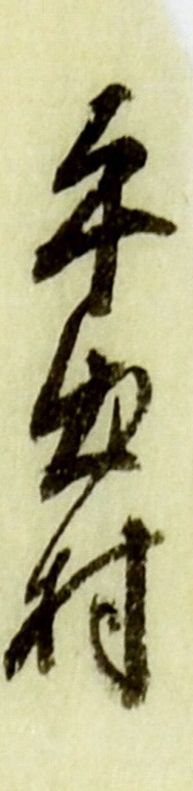平出村
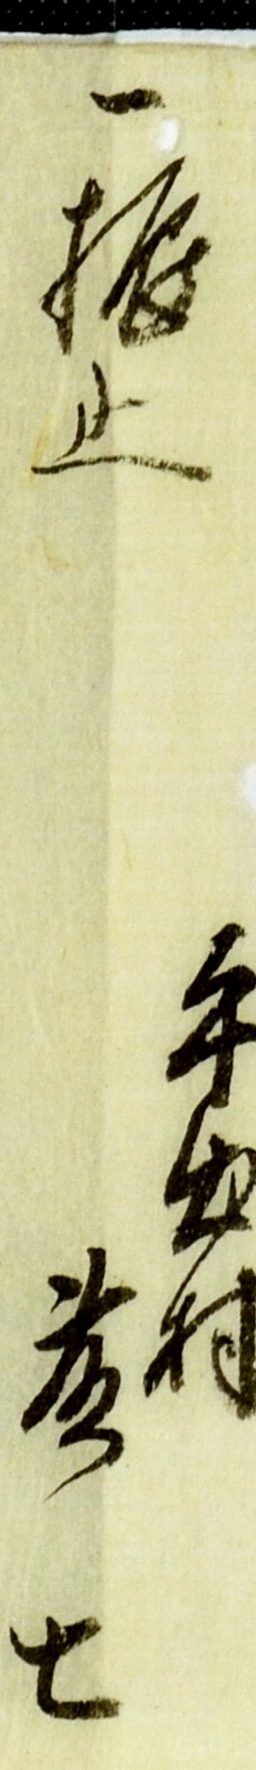一振止藤七
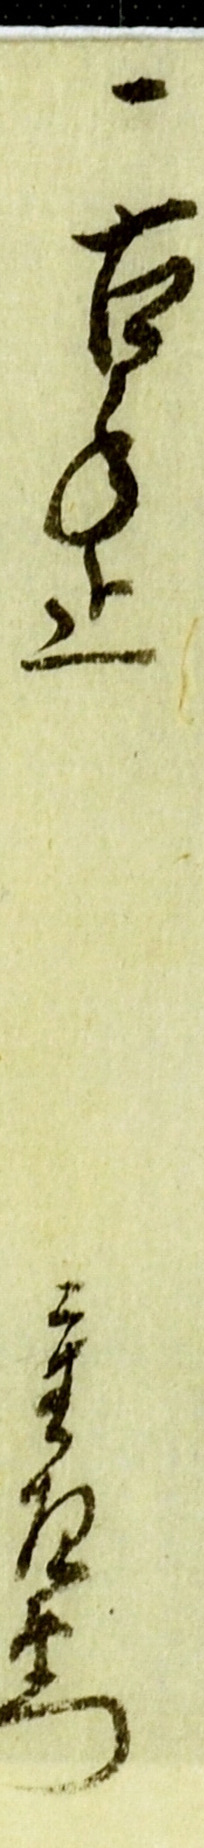一古手止重左衛門
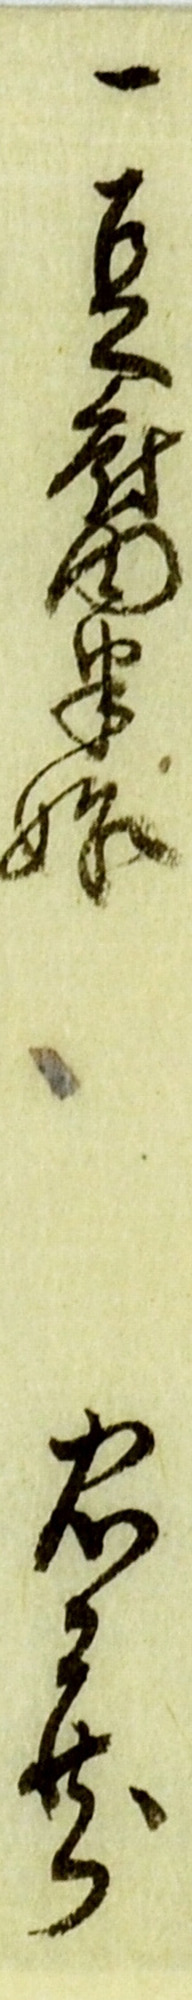一豆腐半始忠蔵
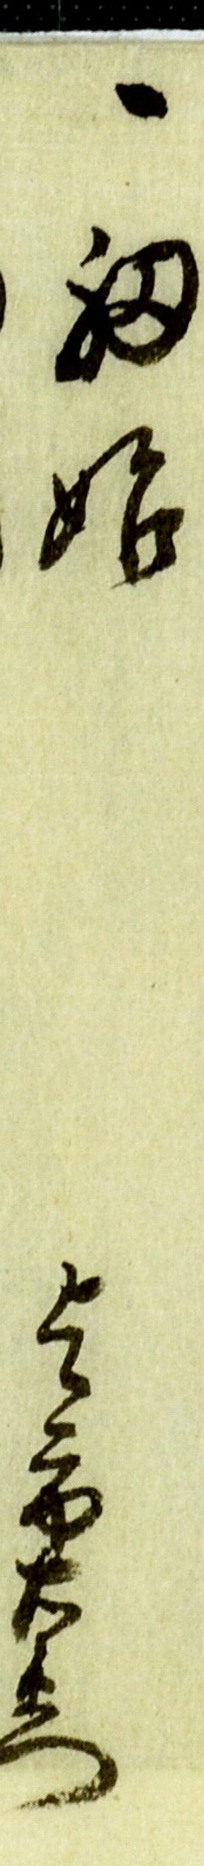一網始与市右衛門
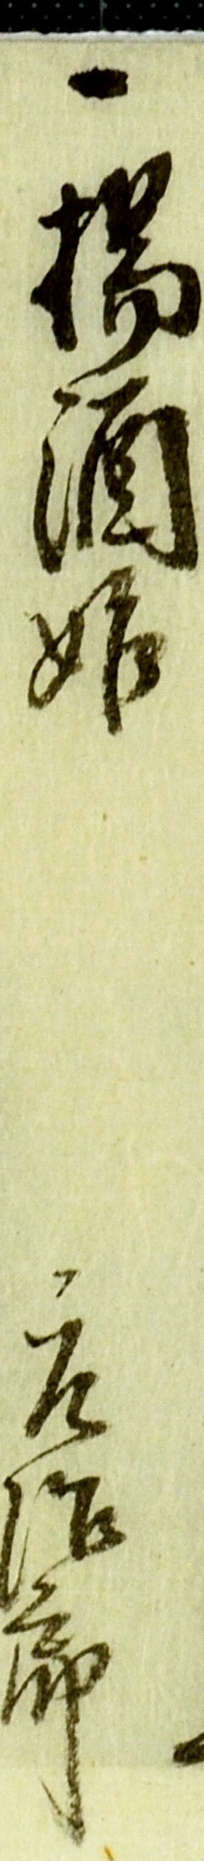一揚酒始元治郎
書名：郷方掛合帳
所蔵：伊那市立高遠町図書館・合同会社AMANE
